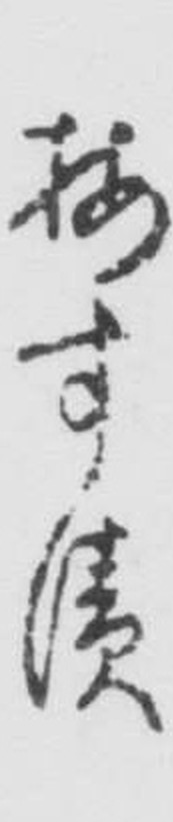梅す漬
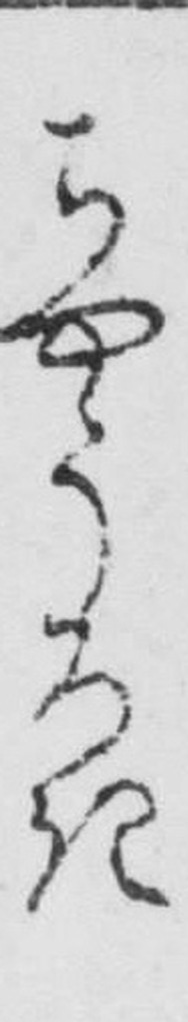ちやうろき
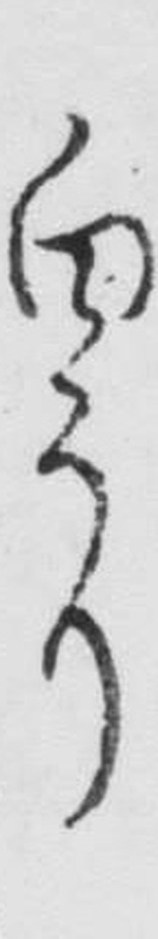白うり
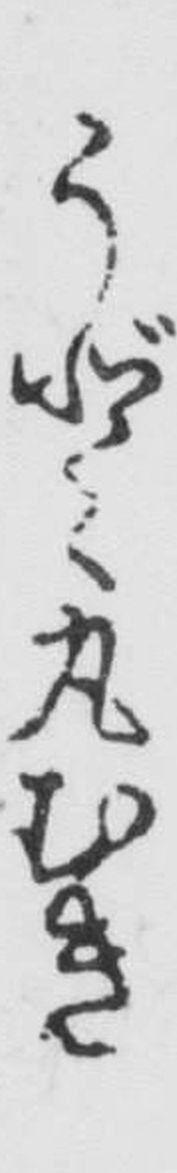うど丸むき
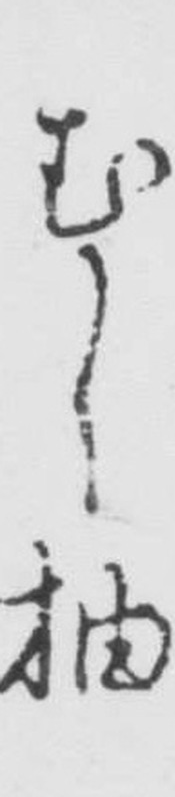むし柚
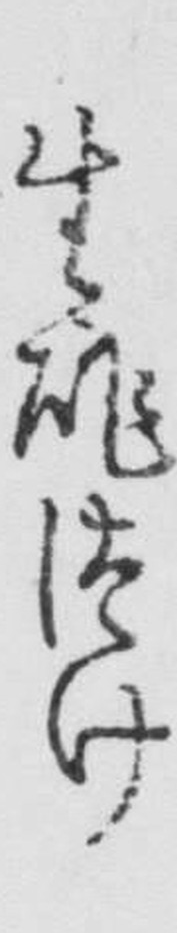生酢つけ
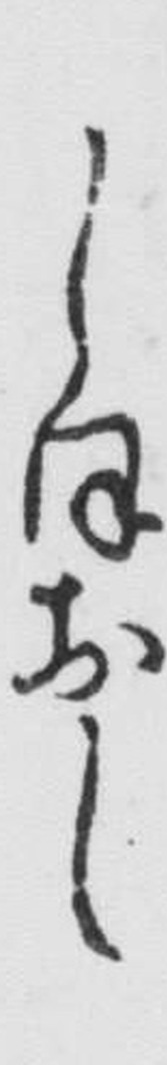しほおし
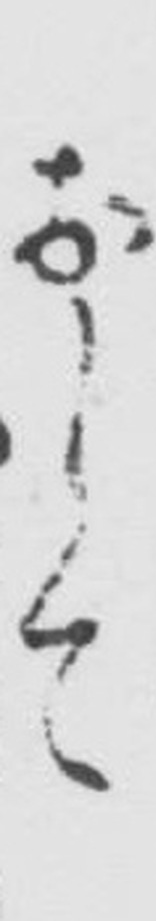おして
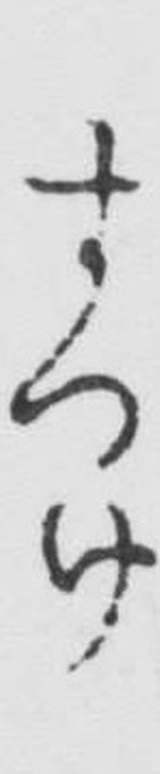すつけ
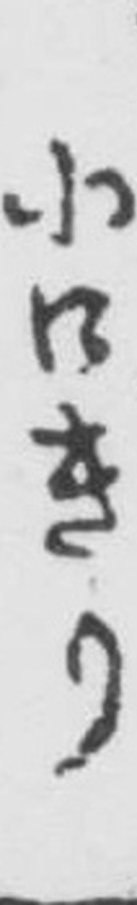小口きり
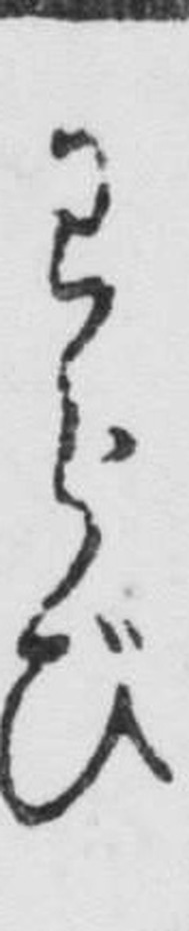わらび
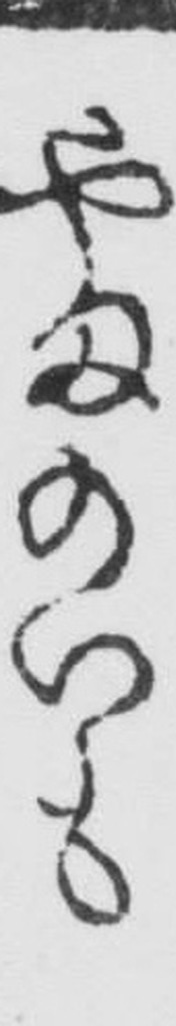やまのいも
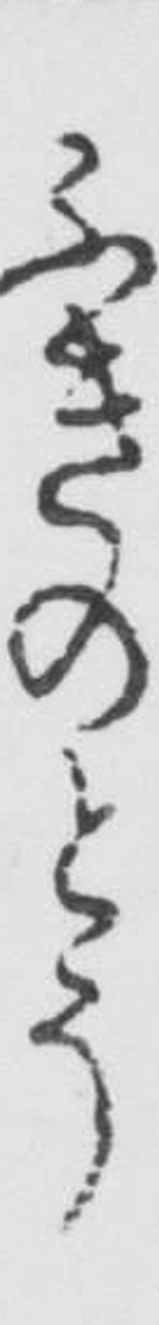ふきのとう
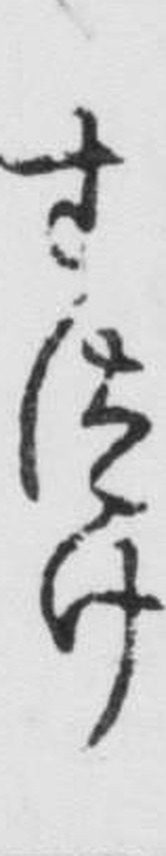すつけ
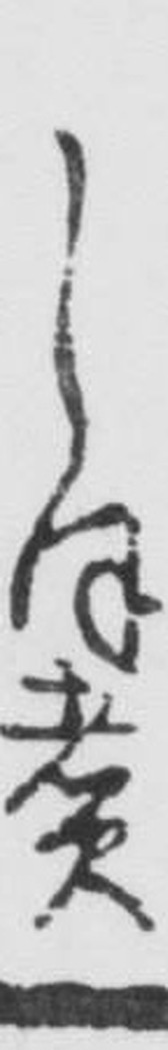しほ煮
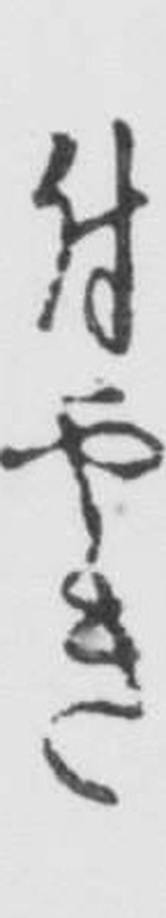付やき
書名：諸家通用/即席料理
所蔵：大阪府立大学学術情報センター 国文学研究資料館
